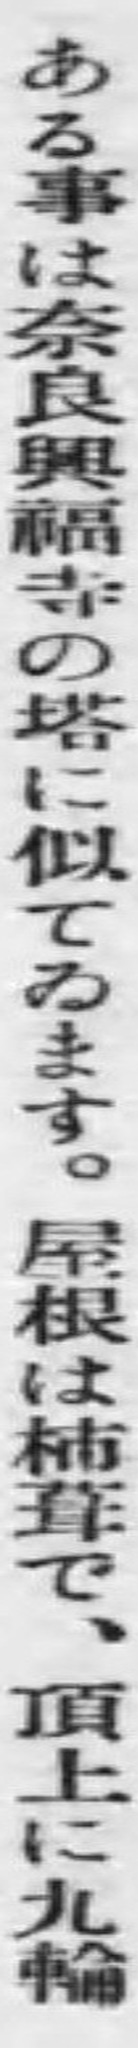ある事は奈良興福寺の塔に似てゐます。屋根は杮葺で、頂上に九輪
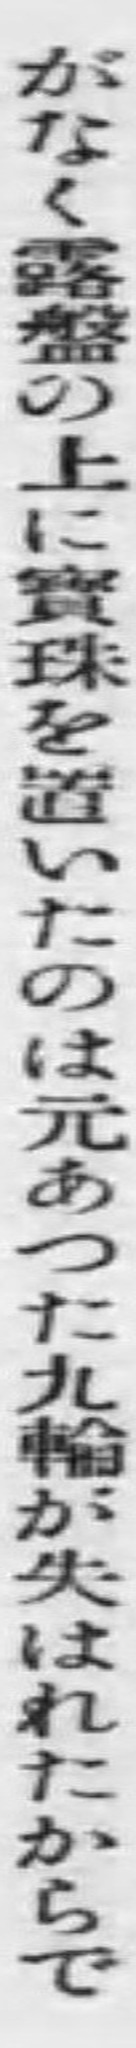がなく露盤の上に宝珠を置いたのは元あつた九輪が失はれたからで
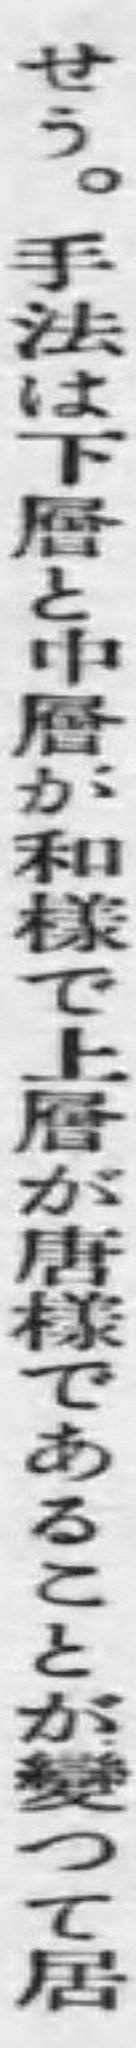せう。手法は下層と中層が和様で上層が唐様であることが変つて居
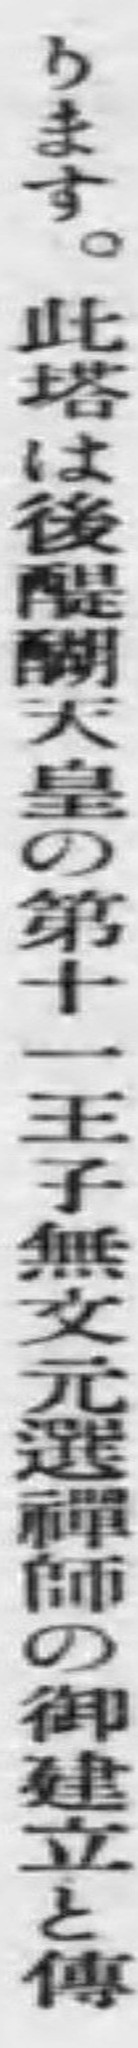ります。此塔は後醍醐天皇の第十一王子無文元選禅師の御建立と伝
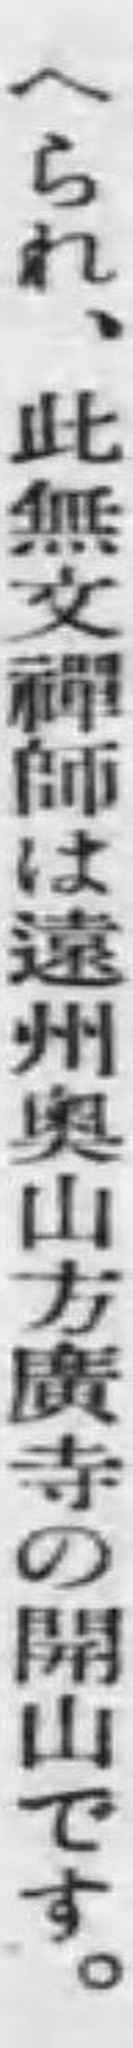へられ、此無文禅師は遠州奥山方広寺の開山です。
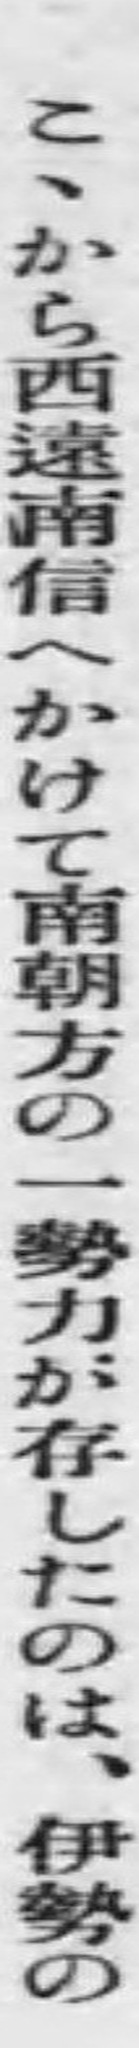こゝから西遠南信へかけて南朝方の一勢力が存したのは、伊勢の
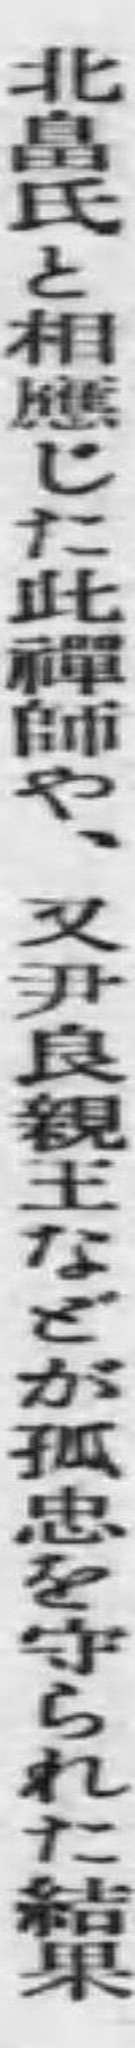北島氏と相応じた此禅師や、又尹良親王などが孤忠を守られた結果
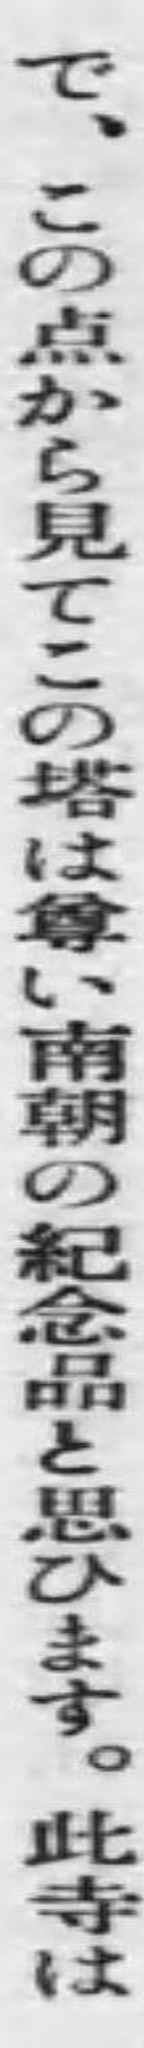で、この点から見てこの塔は尊い南朝の紀念品と思ひます。此寺は
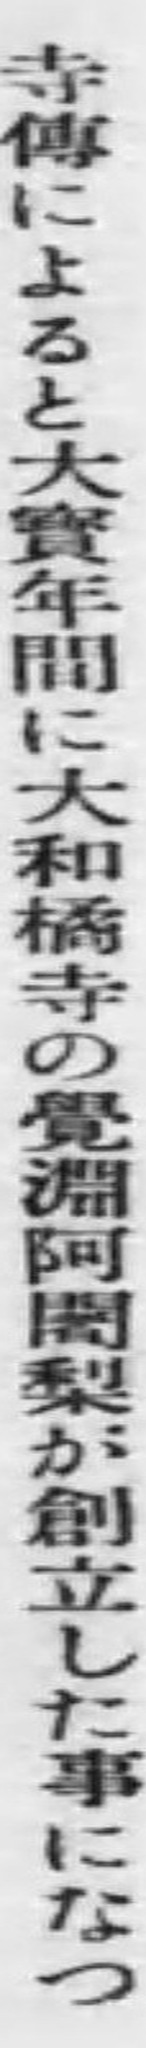寺伝によると大宝年間に大和橘寺の覚淵阿闍梨が創立した事になつ
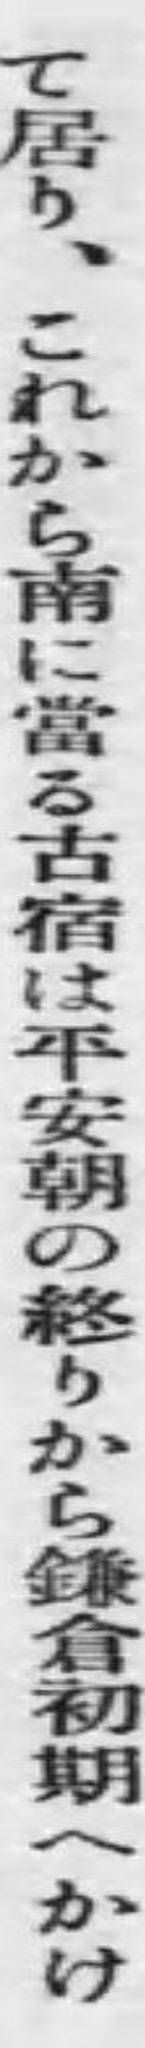て居り、これから南に当る古宿は平安朝の終りから鎌倉初期へかけ
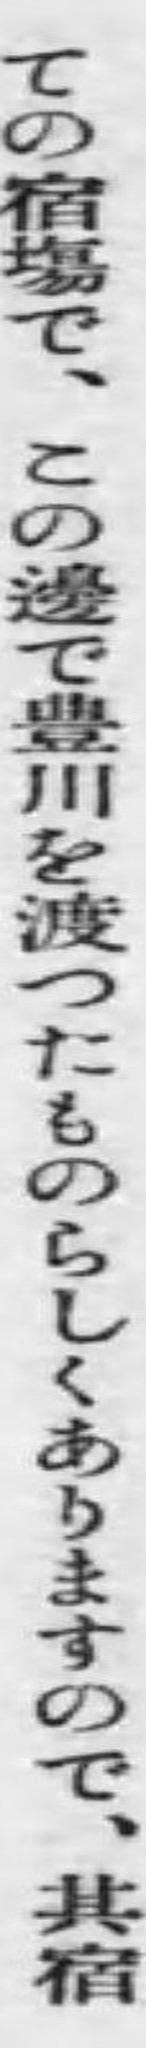ての宿場で、この辺で豊川を渡つたものらしくありますので、其宿
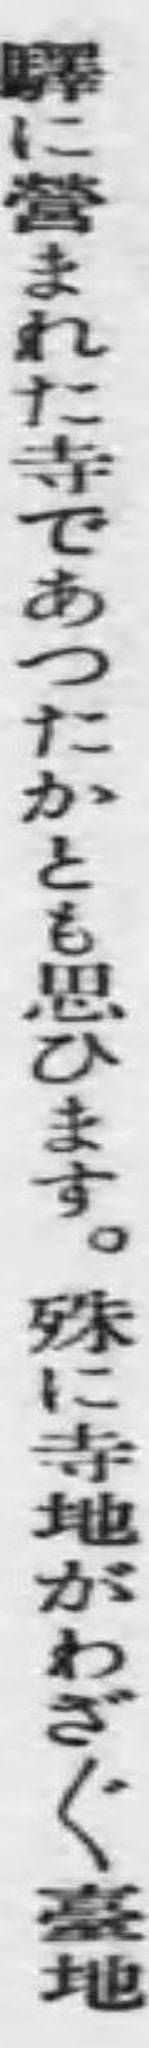駅に営まれた寺であつたかとも思ひます。殊に寺地がわざ〴〵台地
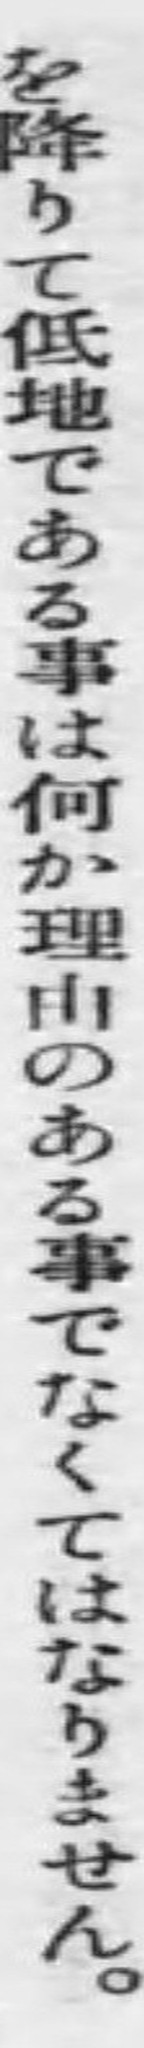を降りて低地である事は何か理由のある事でなくてはなりません。
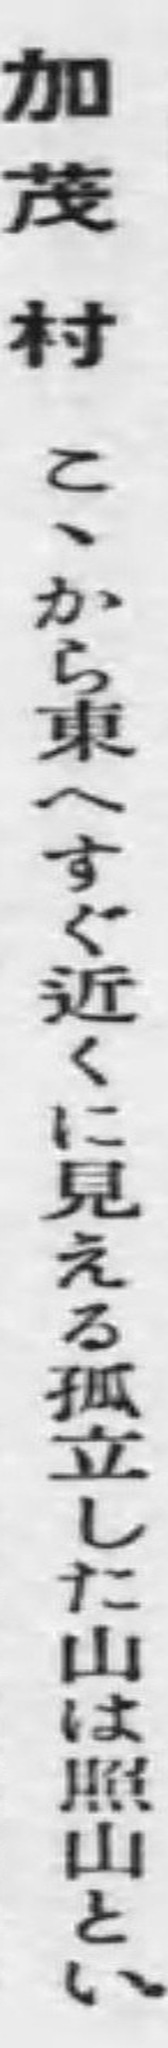加茂村こゝから東へすぐ近くに見える孤立した山は照山とい
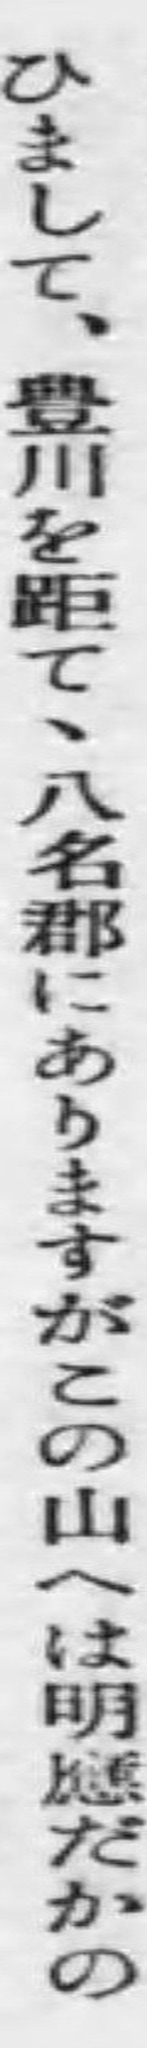ひまして、豊川を距てゝ八名郡にありますがこの山へは明応だかの
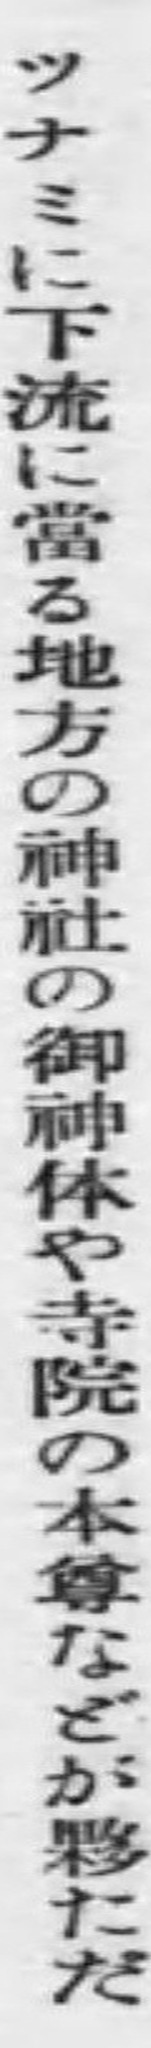ツナミに下流に当る地方の神社の御神体や寺院の本尊などが夥ただ
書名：東三河道中記 : 豊橋市及其附近案内
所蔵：国立国会図書館 National Diet Library, JAPAN
